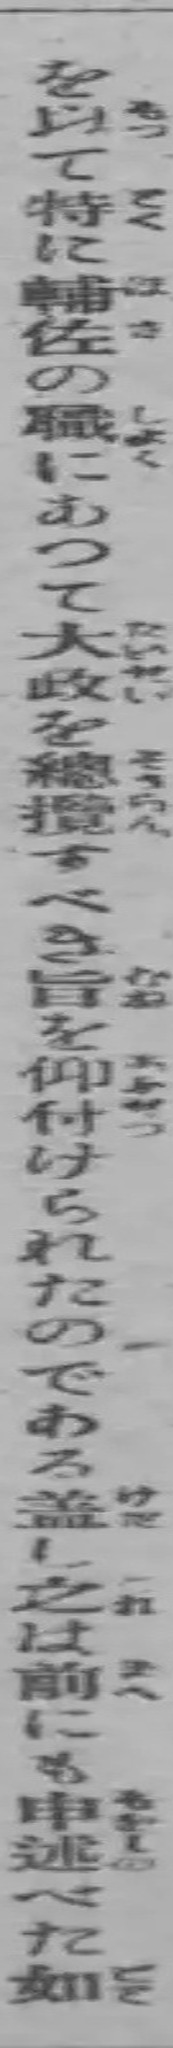を以て特に輔佐の職にあつて大政を総攬すべき旨を仰付けられたのである蓋し之は前にも申述べた如
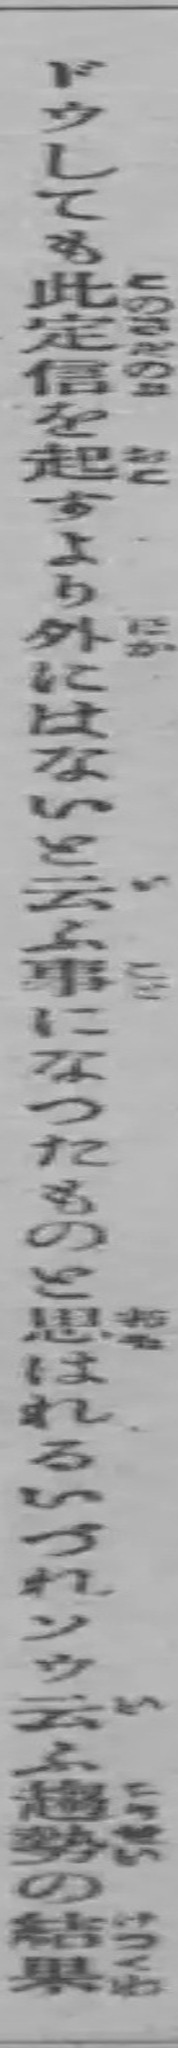ドウしても此定信を起すより外にはないと云ふ事になつたものと思はれるいづれソウ云ふ趨勢の結果
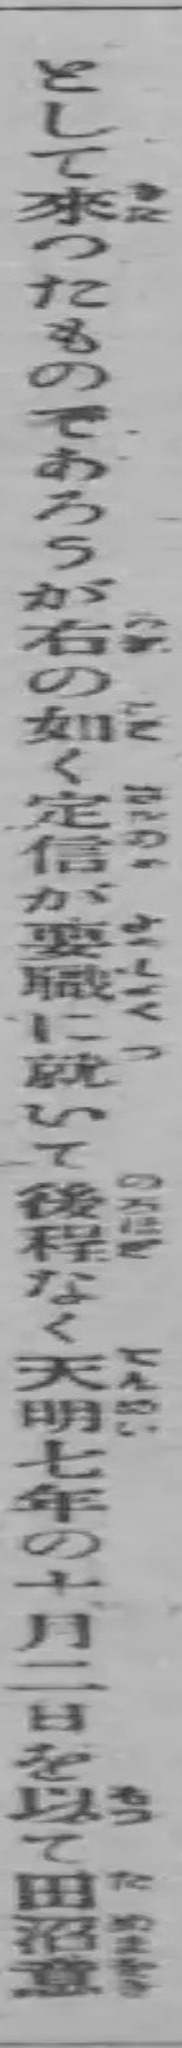として来つたものであろうが右の如く定信が要職に就いて後程なく天明七年の十月二日を以て田沼意
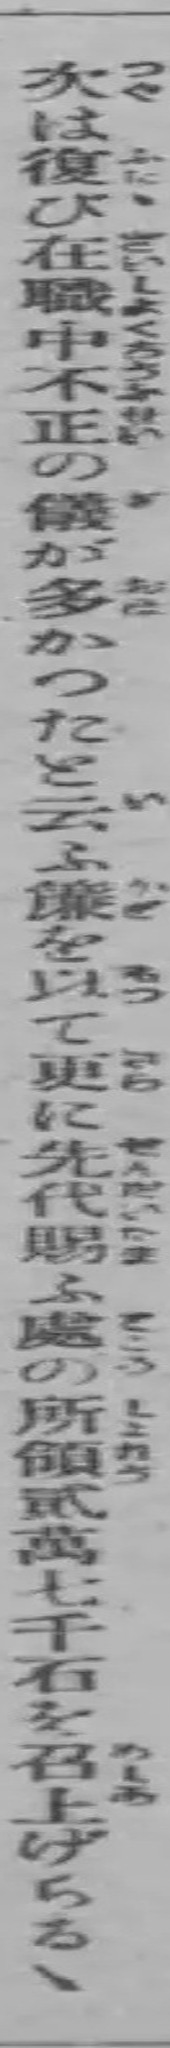次は復び在職中不正の儀が多かつたと云ふ簾を以て更に先代賜ふ処の所領弐万七千石を召上げらるゝ
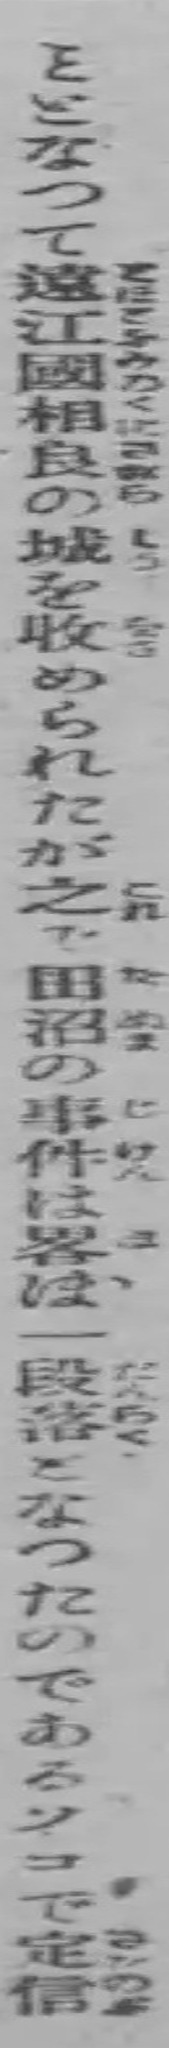こととなつて遠江国相良の城を収められたが之で田沼の事件は略ぼ一段落となつたのであるソコで定信
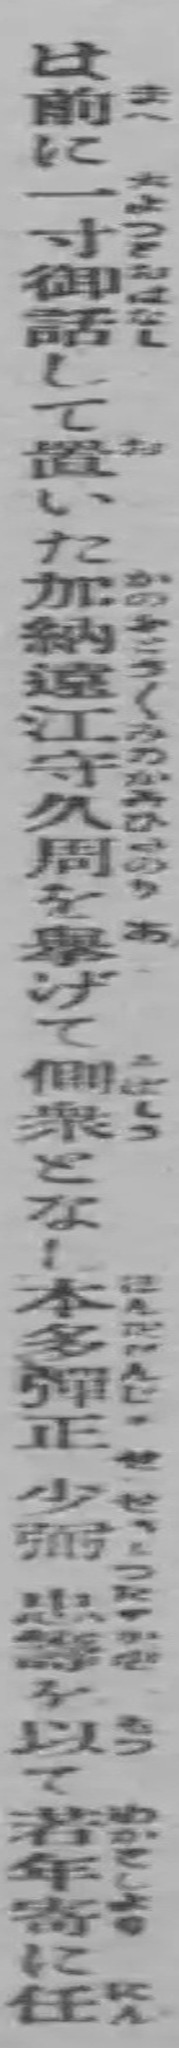は前に一寸御話して置いた加納遠江守久周を挙げて側衆となし本多弾正少弼忠壽を以て若年寄に任
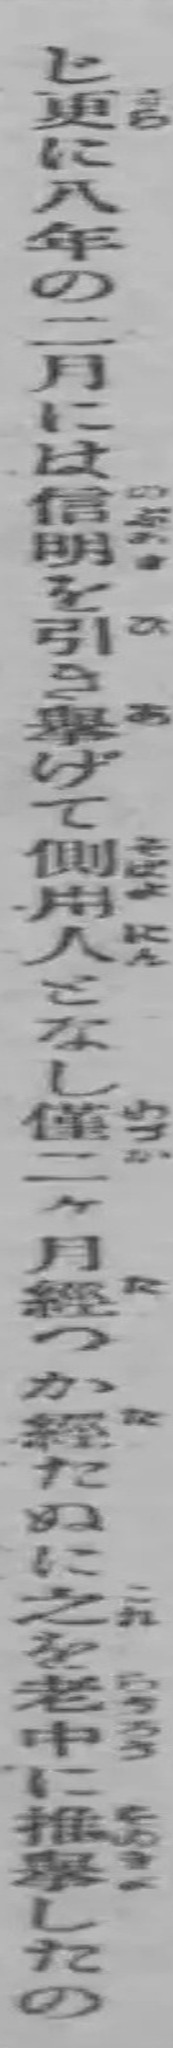じ更に八年の二月には信明を引き挙げて側用人となし僅二ヶ月経つか経たぬに之を老中に推挙したの
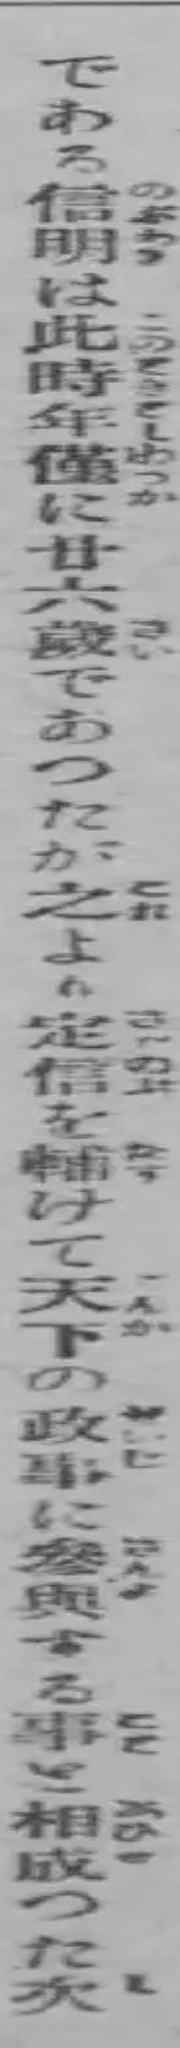寛政の政治である信明は此時年僅に廿六歳であつたが之より定信を輔けて天下の政事に参与する事と相成つた次
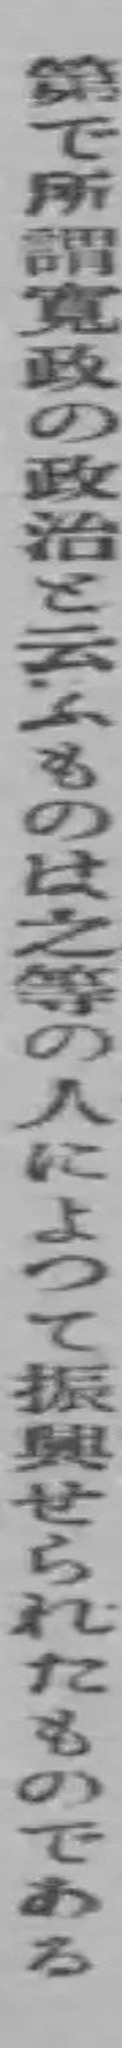第で所謂寛政の政治と云ふものは之等の人によつて振興せられたものである
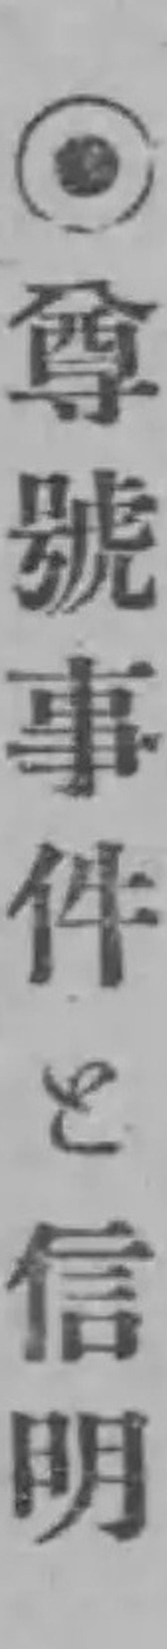⦿尊号事件と信明
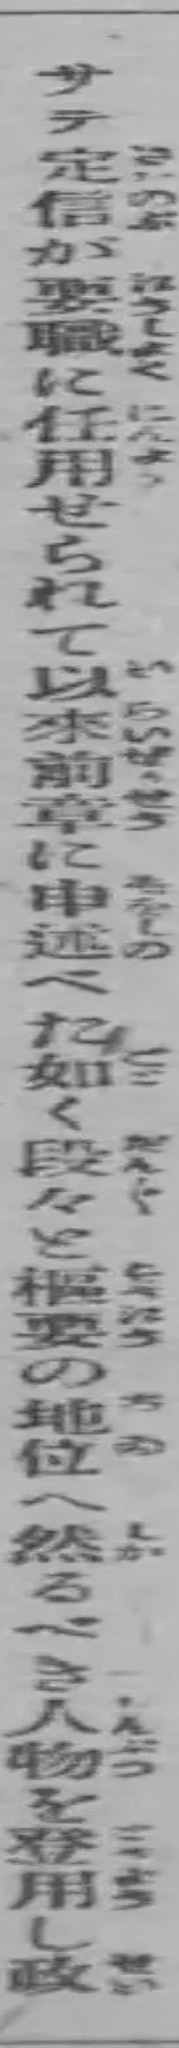サテ定信が要職に任用せられて以来前章に申述べた如く段々と枢要の地位へ然るべき人物を登用し政
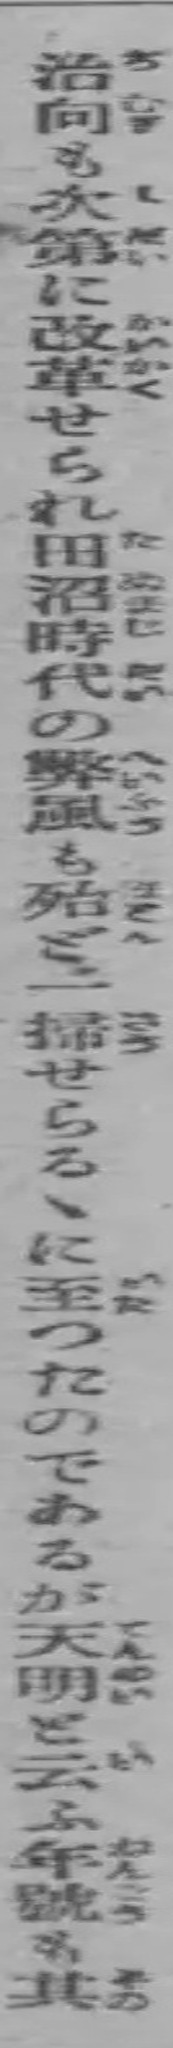治向も次第に改革せられ田沼時代の弊風も殆ど一掃せらるゝに至つたのであるが天明と云ふ年号も其

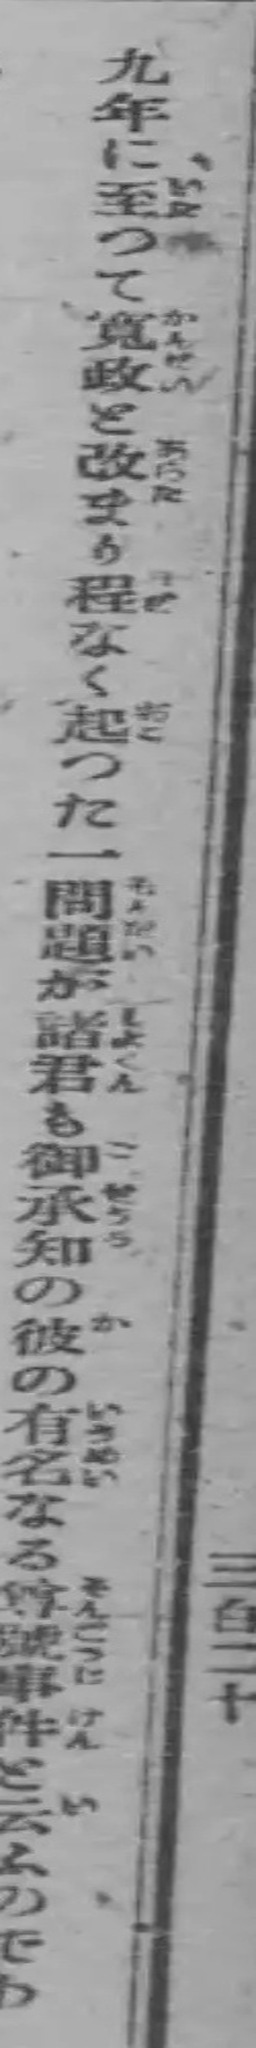九年に至つて寛政と改まり程なく起つた一問題が諸君も御承知の彼の有名なる尊号事件と云ふのであ
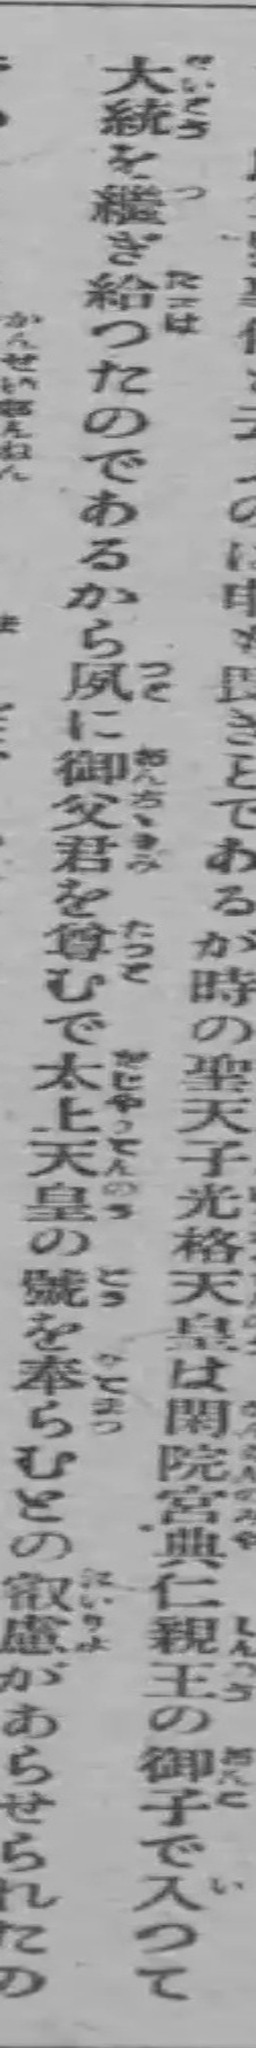大統を継ぎ給つたのであるから夙に御父君を尊むで太上天皇の号を奉らむとの叡慮があらせられたの
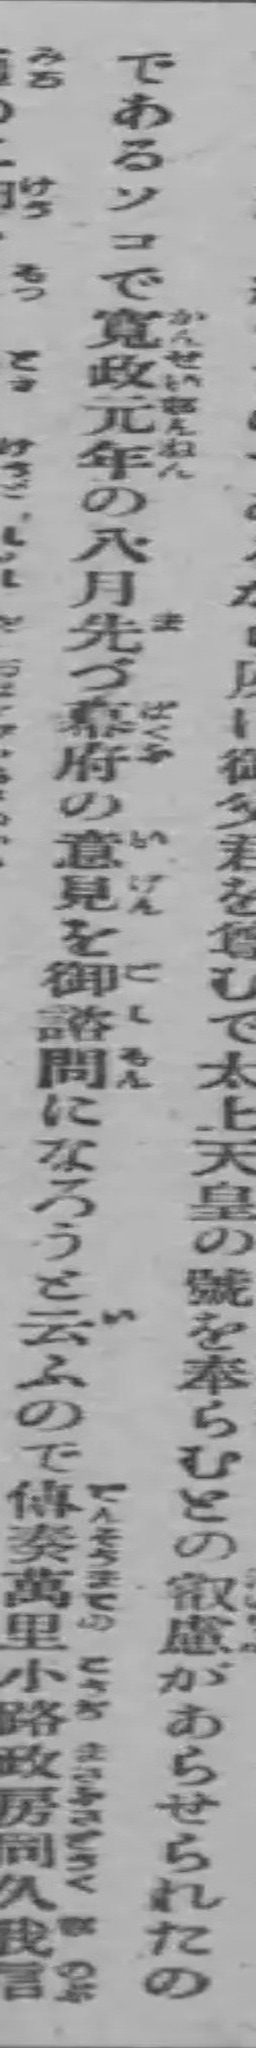であるソコで寛政元年の八月先づ幕府の意見を御諮問になろうと云ふので伝奏万里小路政房同久我信
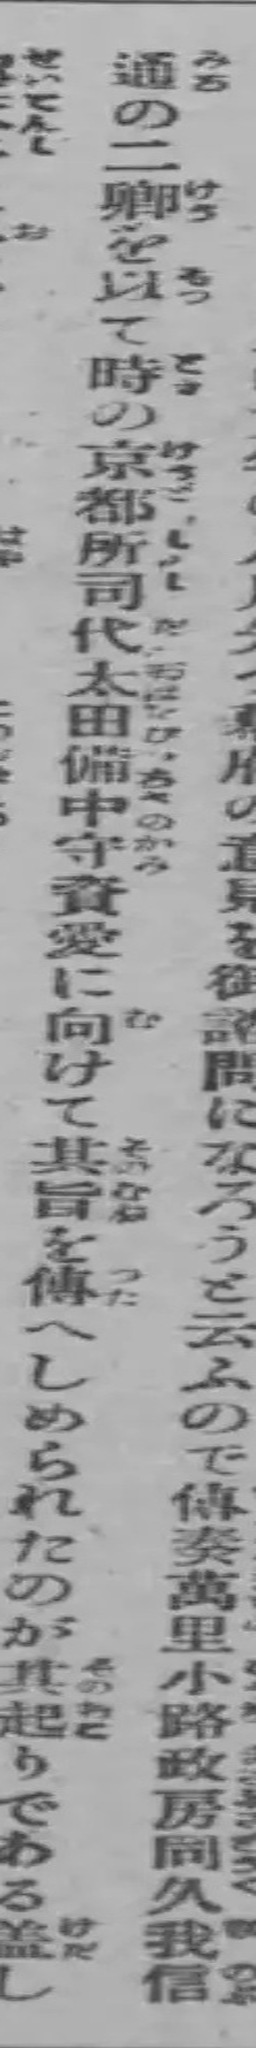通の二卿を以て時の京都所司代太田備中守資愛に向けて其旨を伝へしめられたのが其起りである蓋し
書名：豊橋市史談
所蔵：国立国会図書館 National Diet Library, JAPAN
